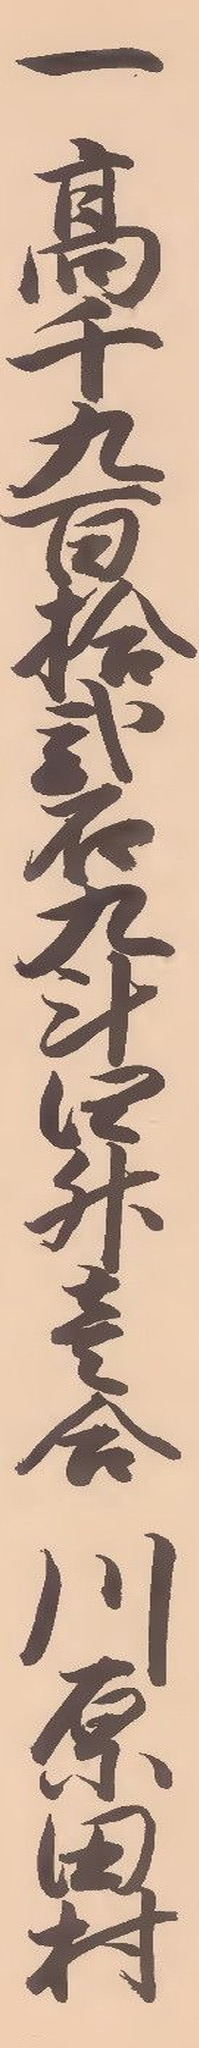一高千九百拾弐石九斗四升壱合川原田村
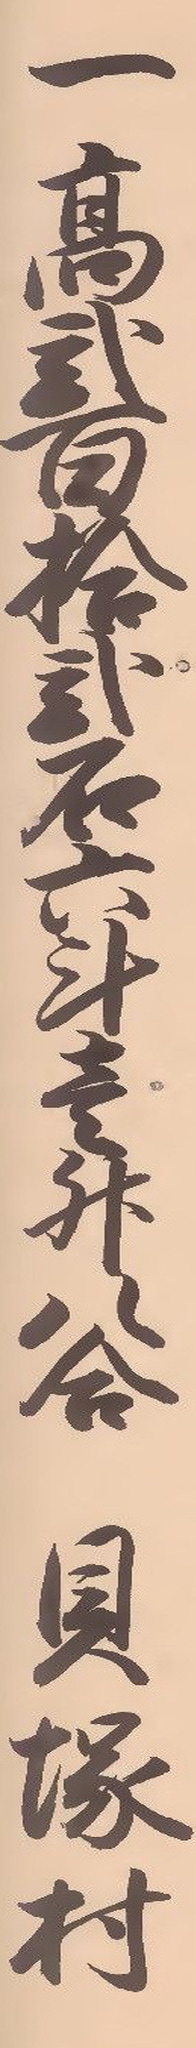一高弐百拾弐石六斗壱升八合貝塚村
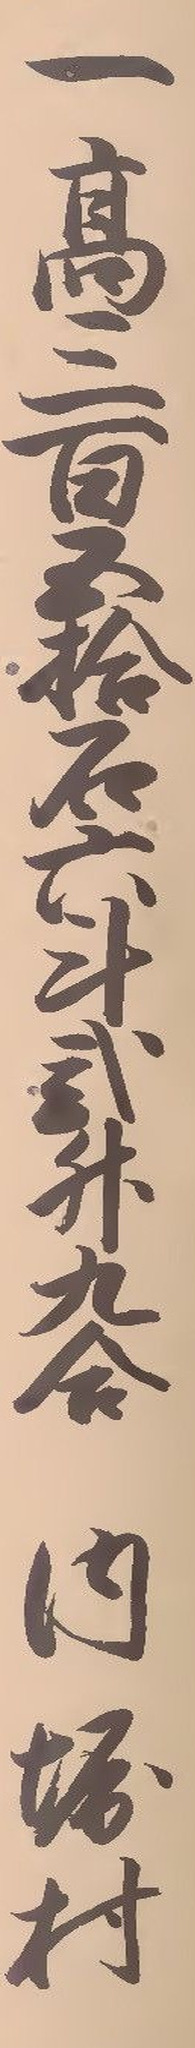一高三百五拾石六斗弐升九合内堀村
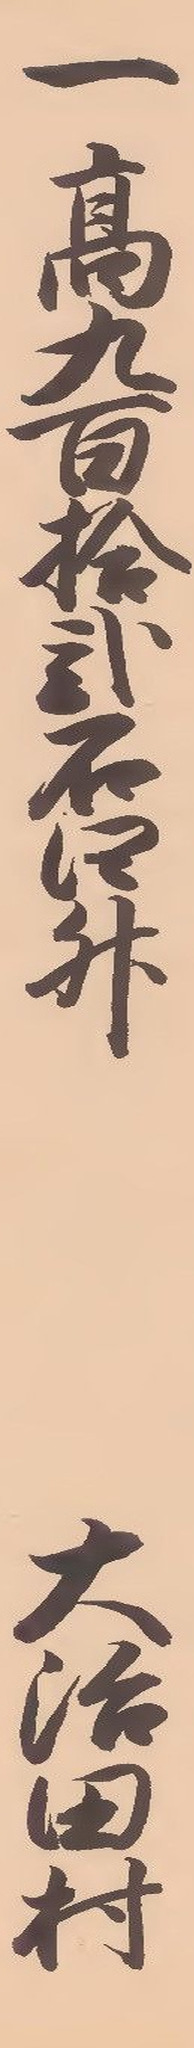一高九百拾弐石四升大治田村
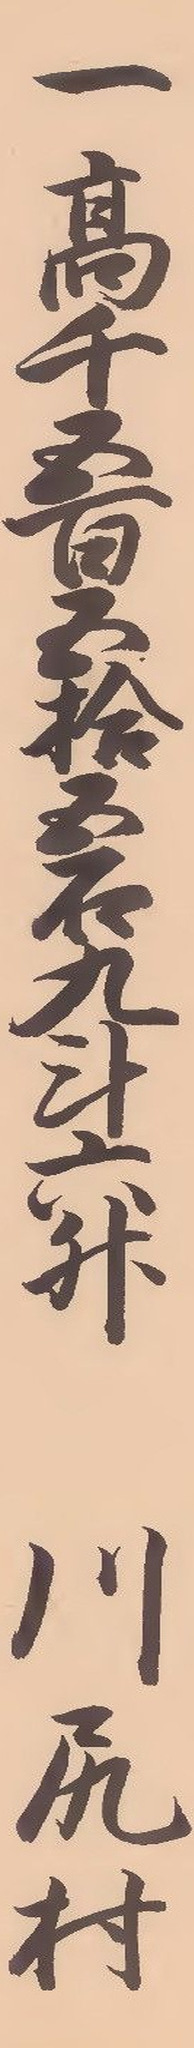一高千五百五拾五石九斗六升川尻村
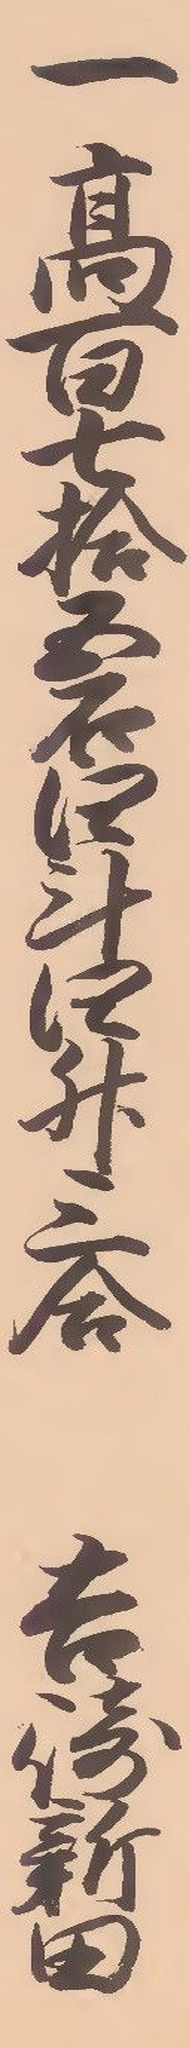一高百七拾五石四斗四升三合吉崎新田

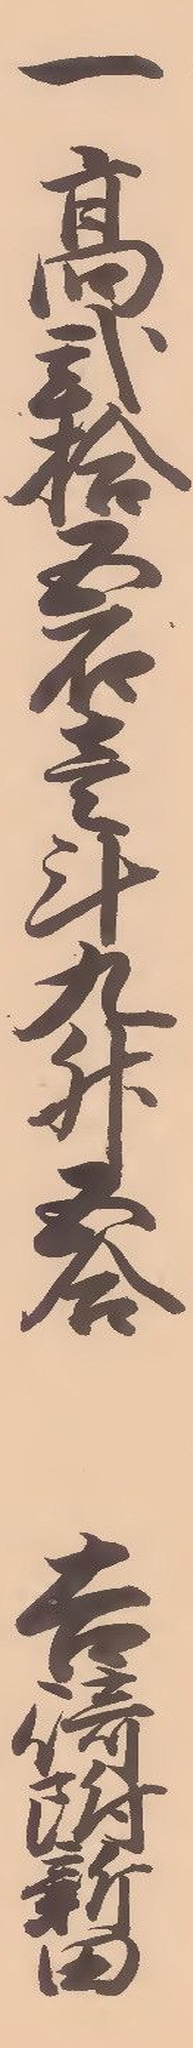一高弐拾五石壱斗九升五合吉崎附新田
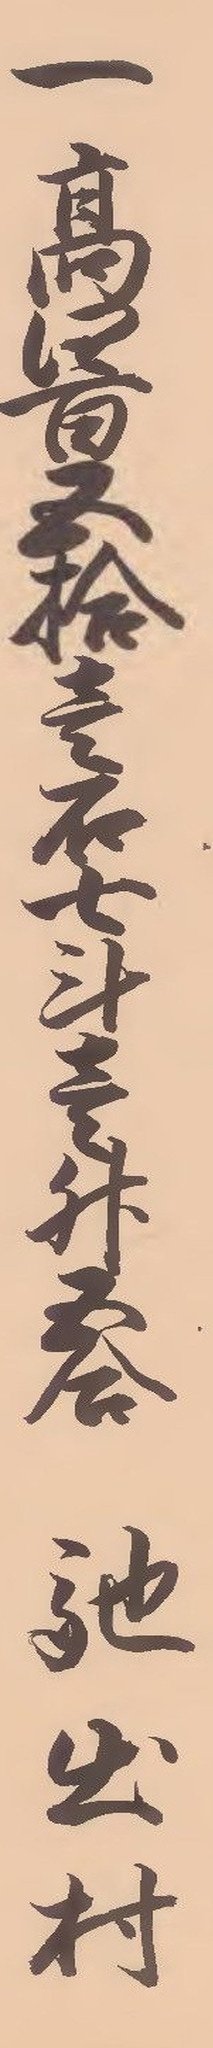一高四百五拾壱石七斗壱升五合馳出村
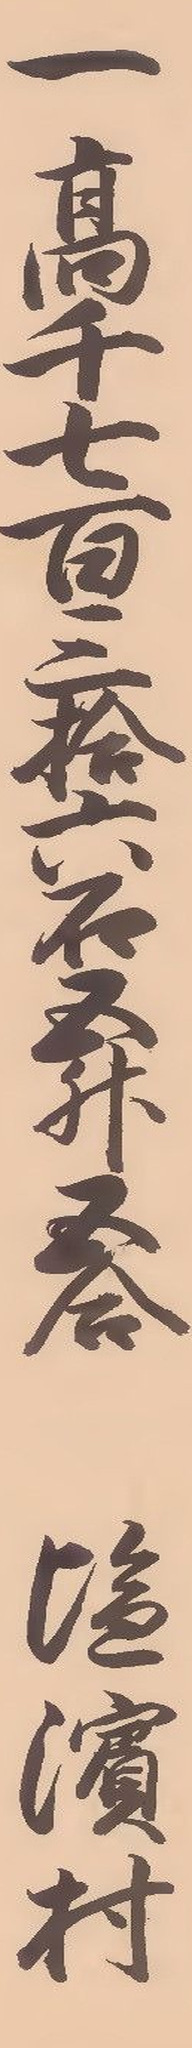一高千七百三拾六石五升五合塩浜村
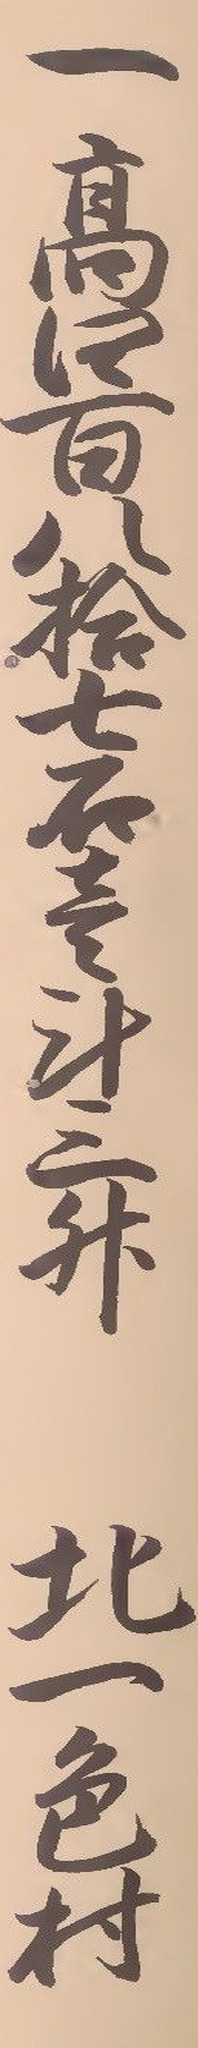一高四百八拾七石壱斗三升北一色村
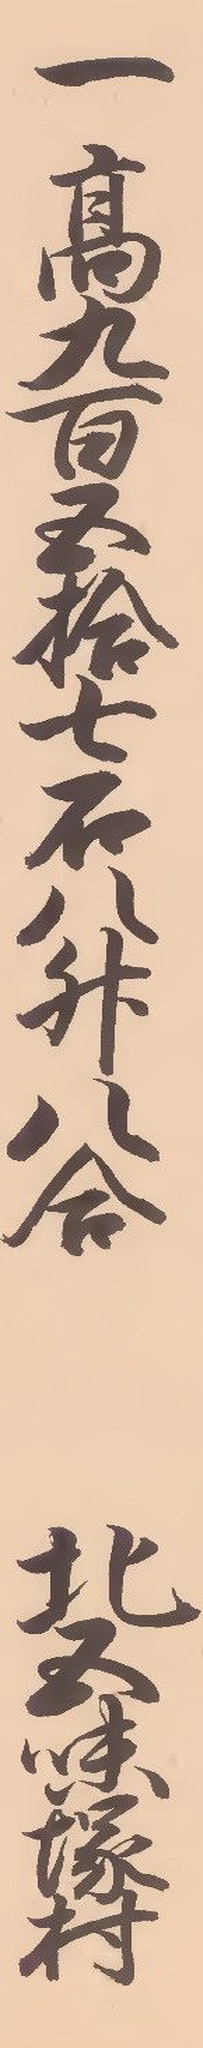一高九百五拾七石八升八合北五味塚村
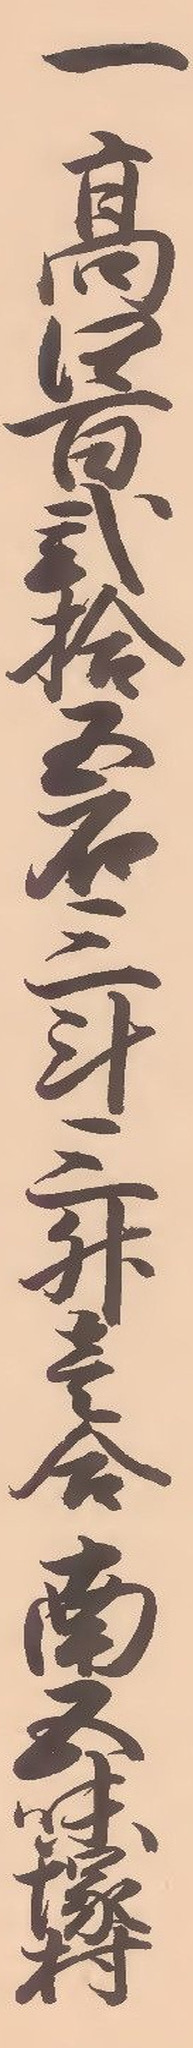一高四百弐拾五石三斗三升壱合南五味塚村

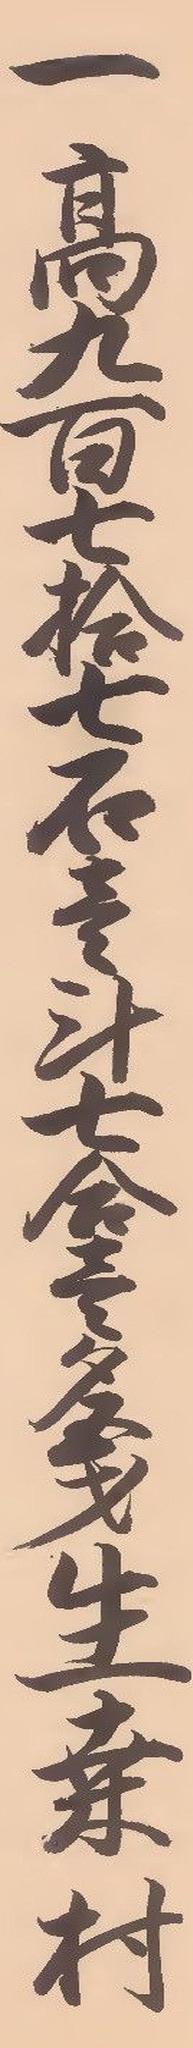一高九百七拾七石壱斗七合壱勺五才生桑村
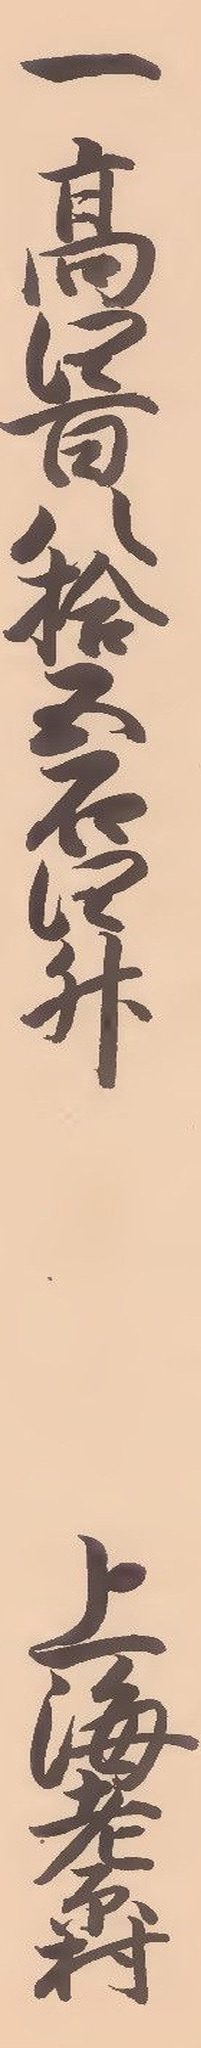一高四百八拾五石四升上海老原村
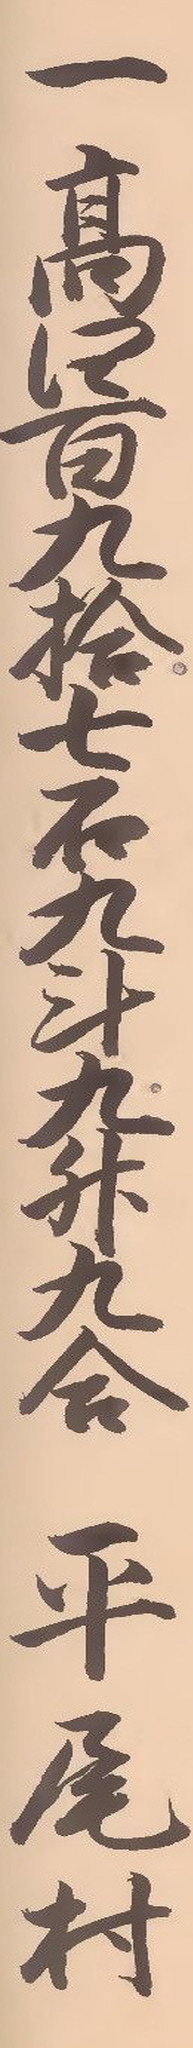一高四百九拾七石九斗九升九合平尾村
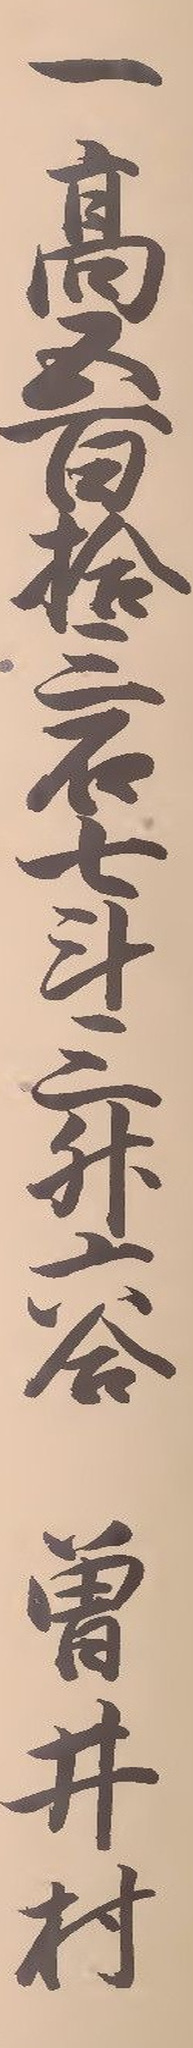一高五百拾三石七斗三升六合曽井村
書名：伊勢国郷帳
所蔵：国立公文書館 National Archives of Japan
